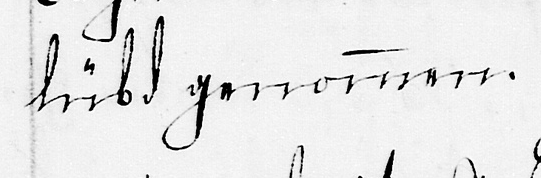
lübd genommen.
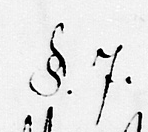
§. 7.
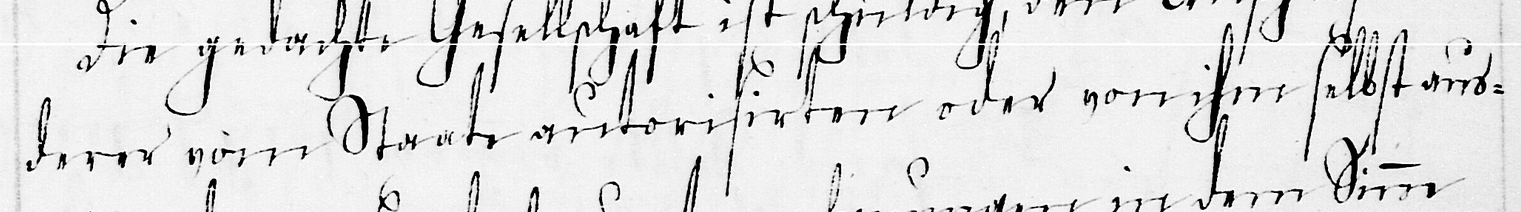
derer vom Staate autorisirten oder von ihm selbst aus¬
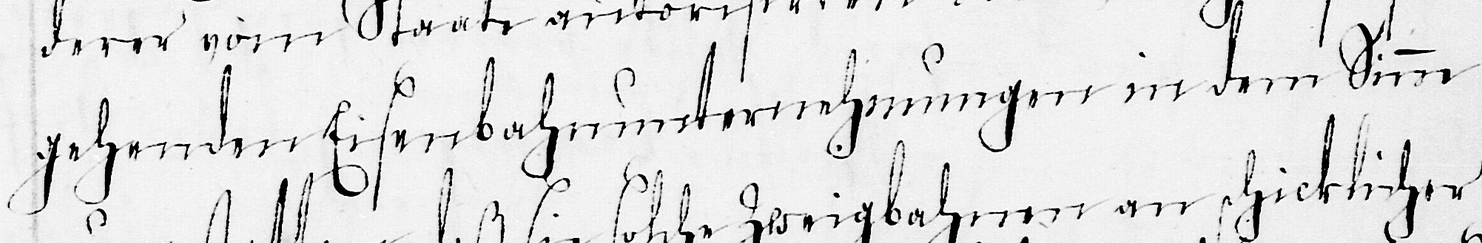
gehenden Eisenbahnunternehmungen in dem Sinne
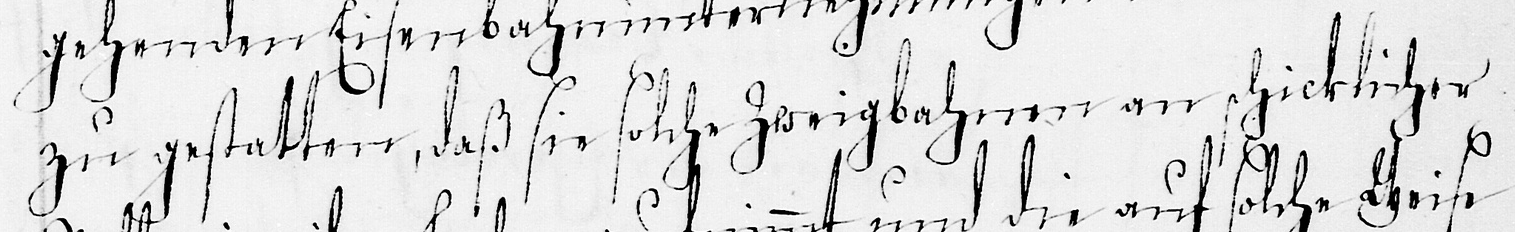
zu gestatten, daß sie solche Zweigbahnen an schicklicher
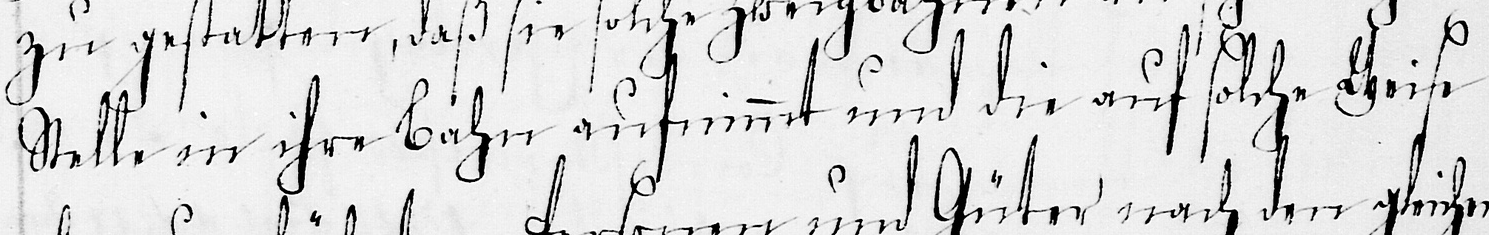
Stelle in ihre Bahn aufnimmt und die auf solche Weise
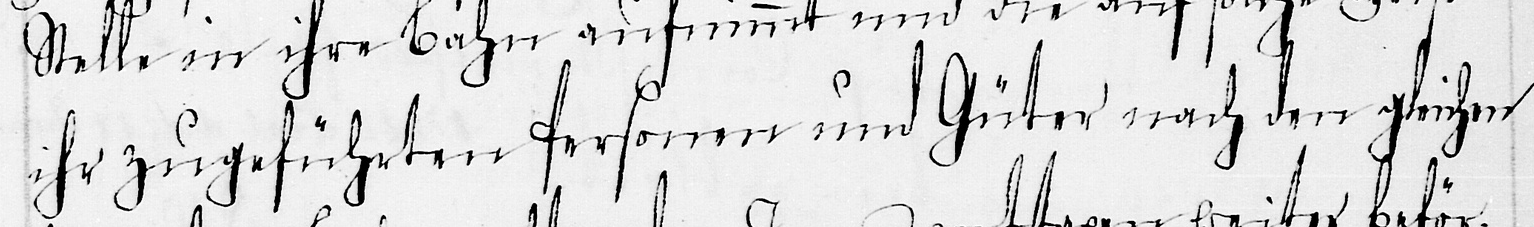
ihr zugeführten Personen und Güter nach den gleichen
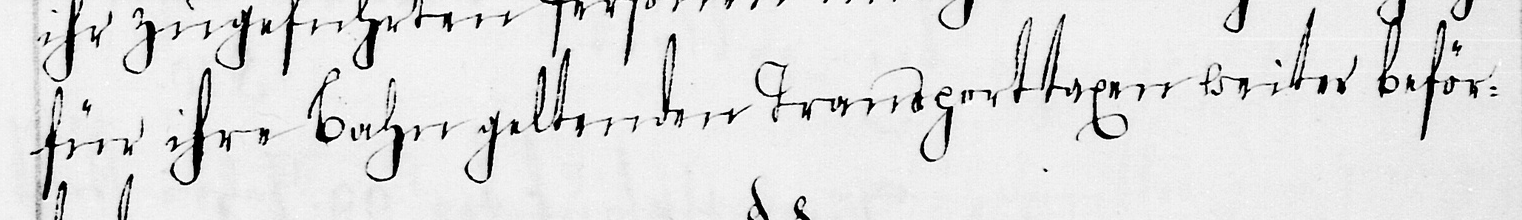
für ihre Bahn geltenden Transporttaxen weiter beför¬
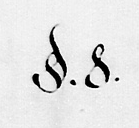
§. 8.
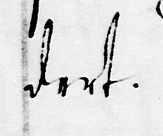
dert.
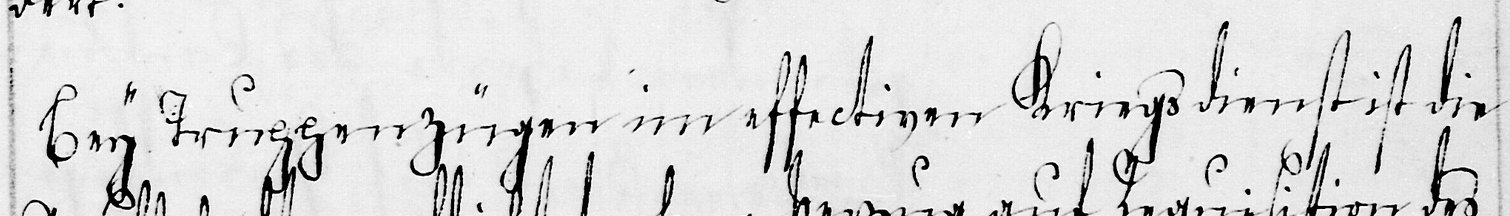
Bey Truppenzügen im effectiven Kriegsdienst ist die
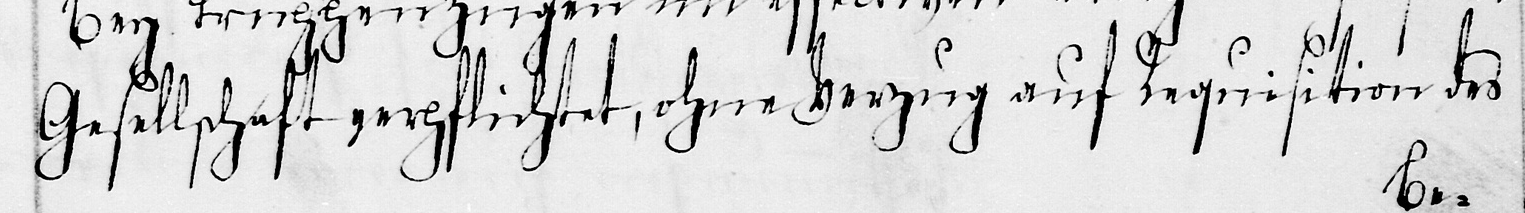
Gesellschaft verpflichtet, ohne Verzug auf Requisition des
